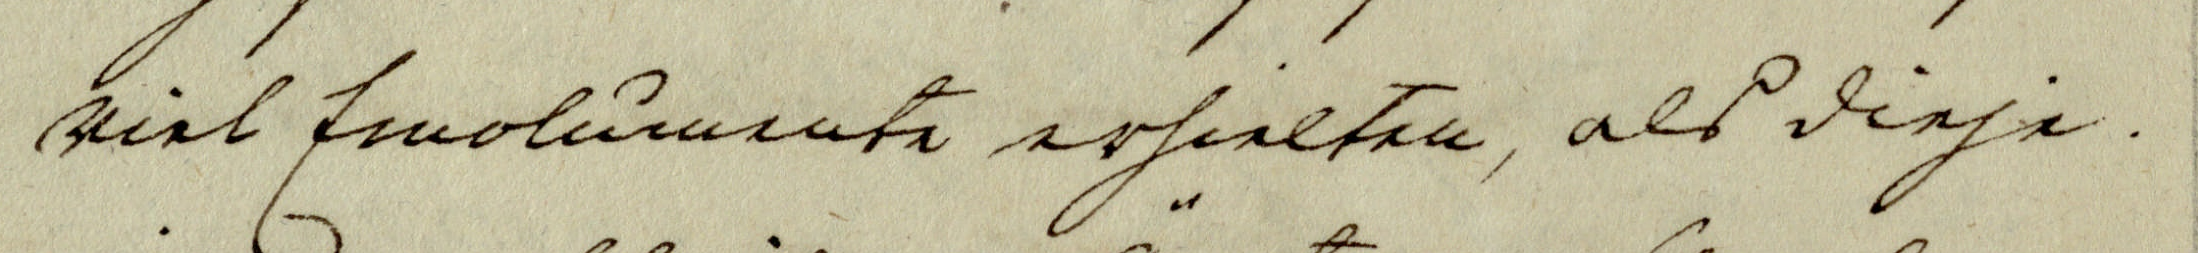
viel Emolumente erhielten, als dieje¬
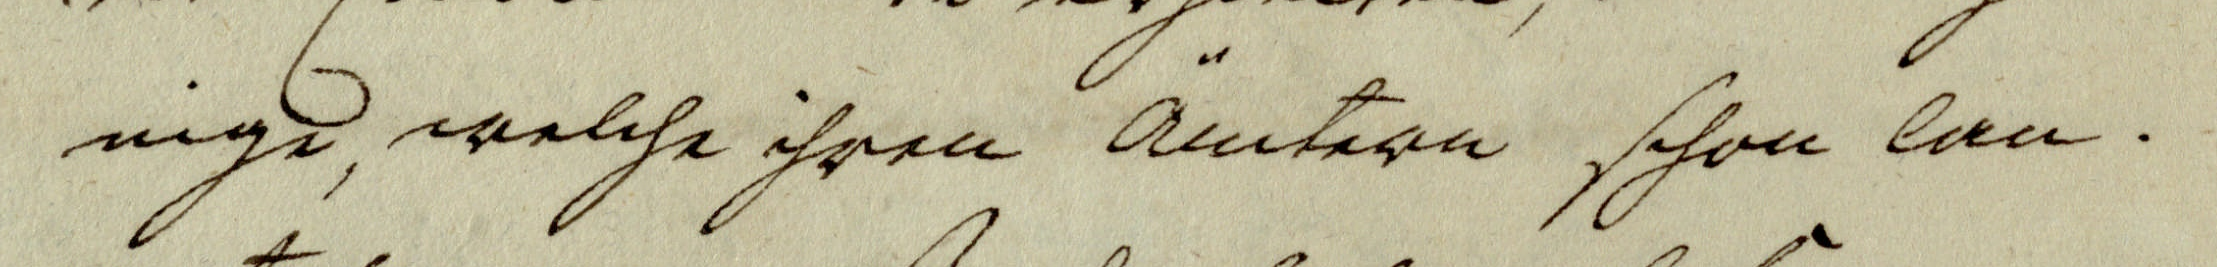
nige, welche ihren Ämtern schon lan¬
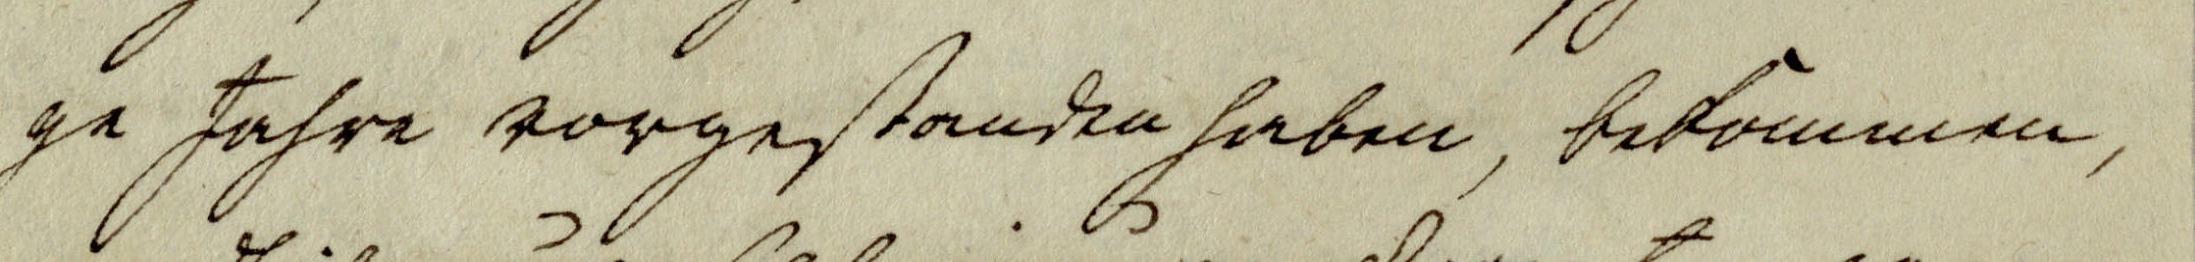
ge Jahre vorgestanden haben, bekommen,
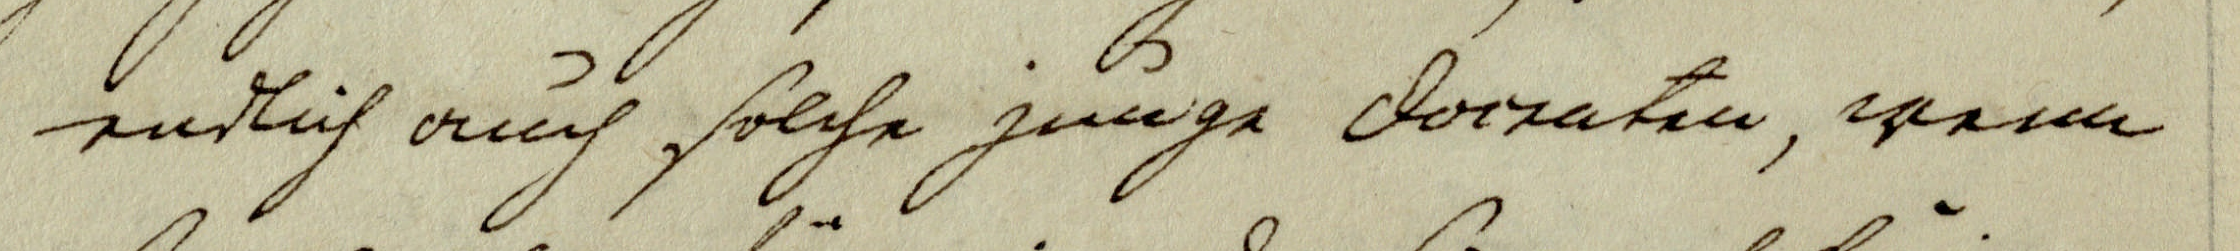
endlich auch solche junge Docenten, wenn
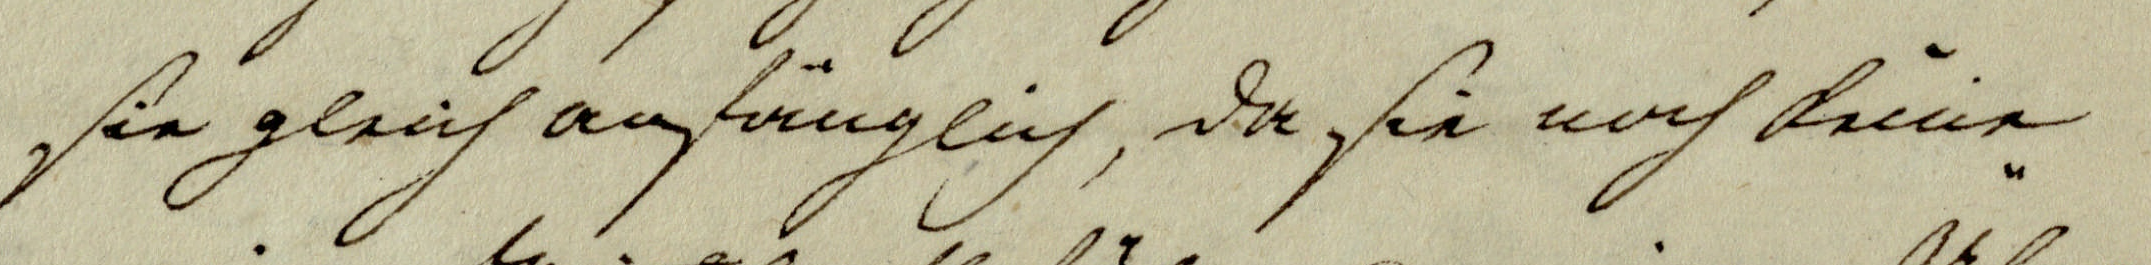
sie gleich anfänglich, da sie noch keine
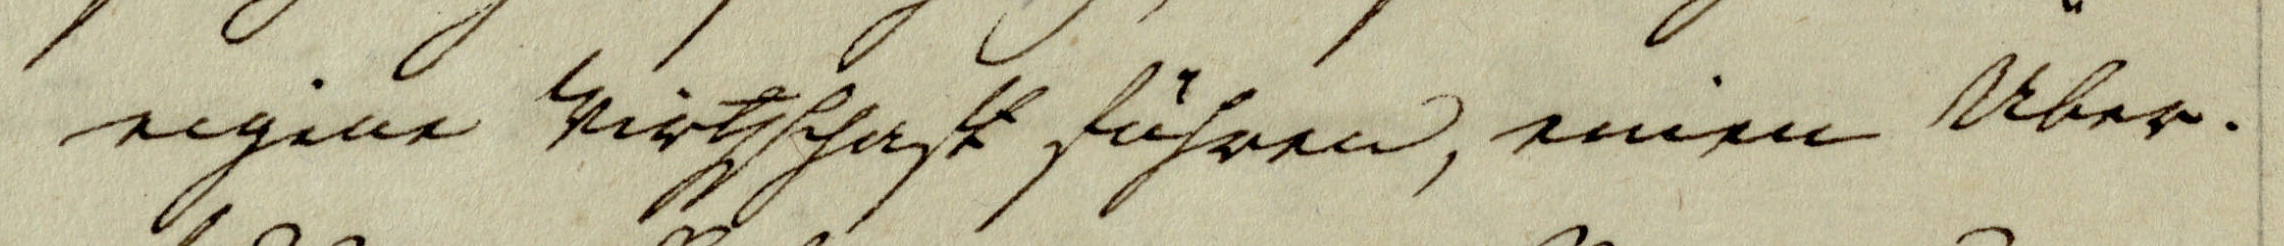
eigene Wirthschaft führen, einen Über¬
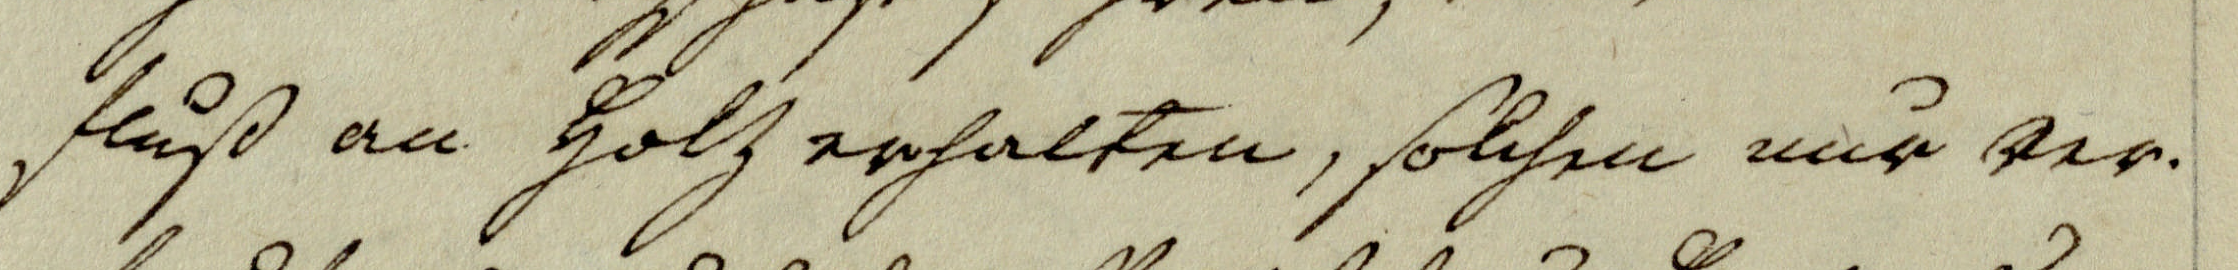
fluß an Holz erhalten, solchen nur ver¬
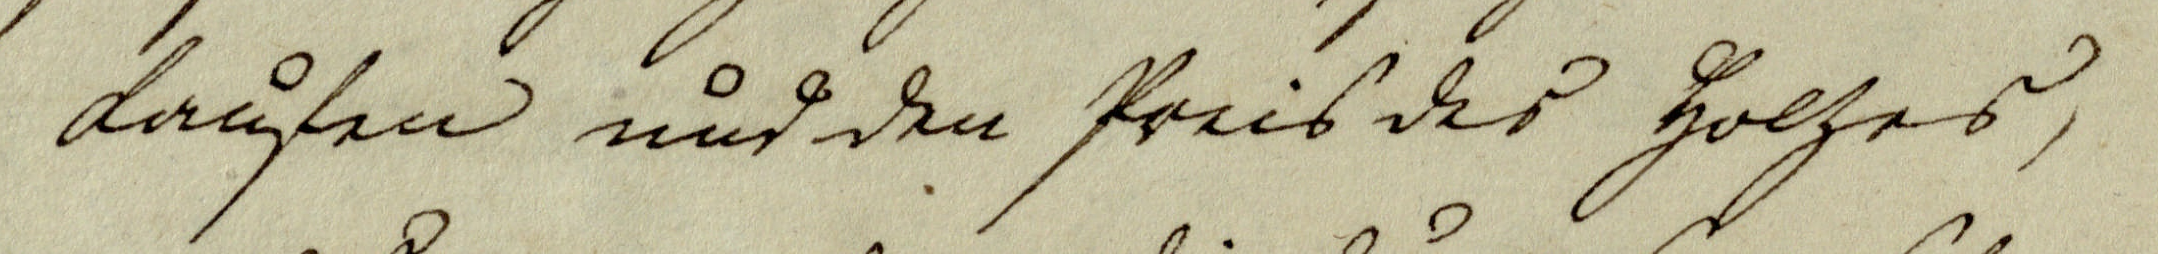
kaufen und den Preis des Holzes,
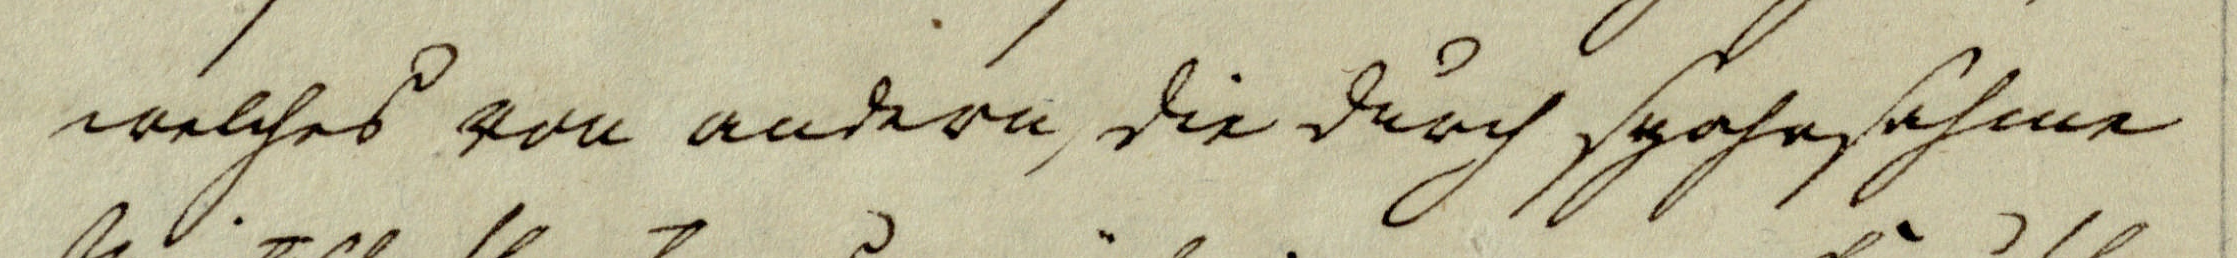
welches von andern, die doch spahrsahme
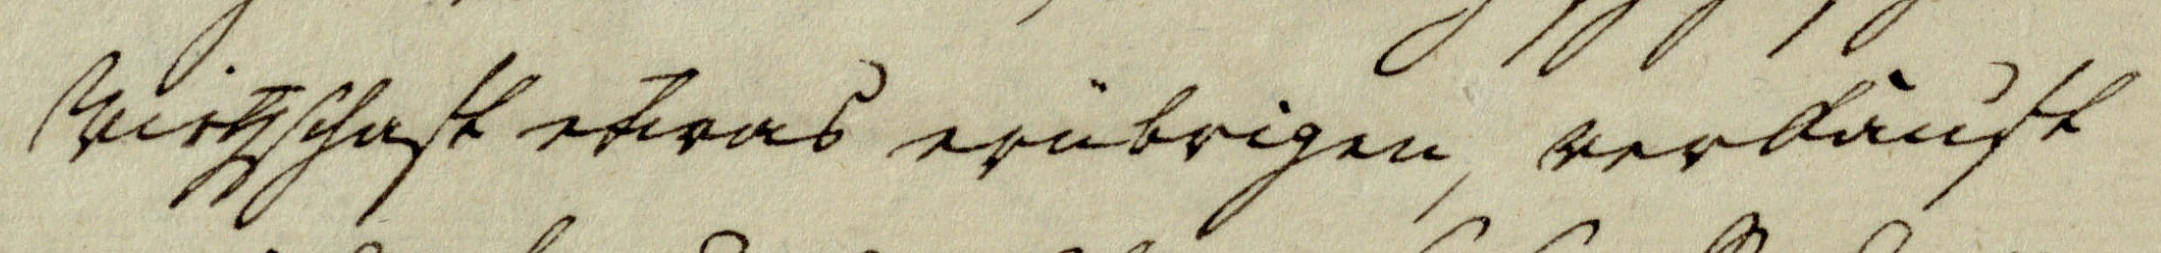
Wirthschaft etwas erübrigen verkauft
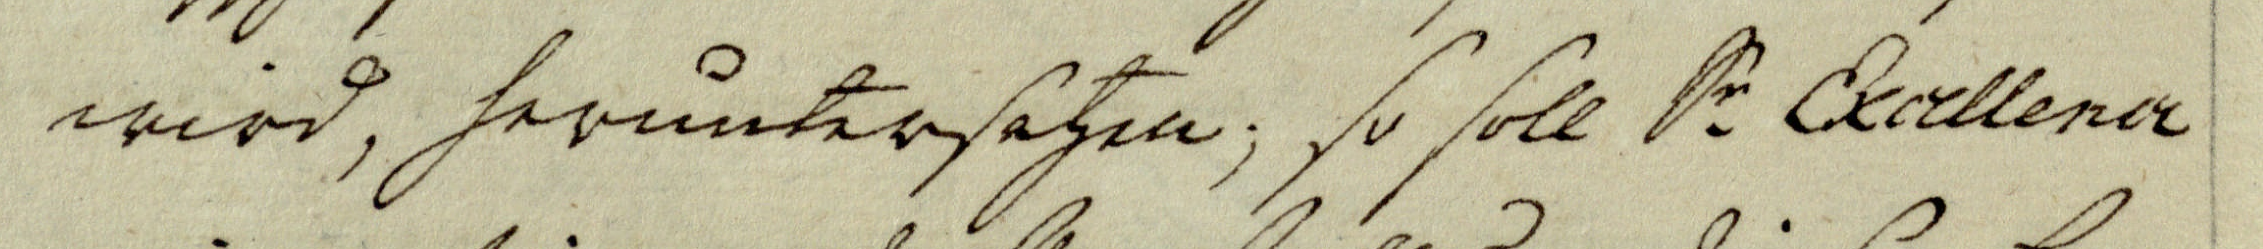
wird, heruntersetzen; so soll Sr Excellence
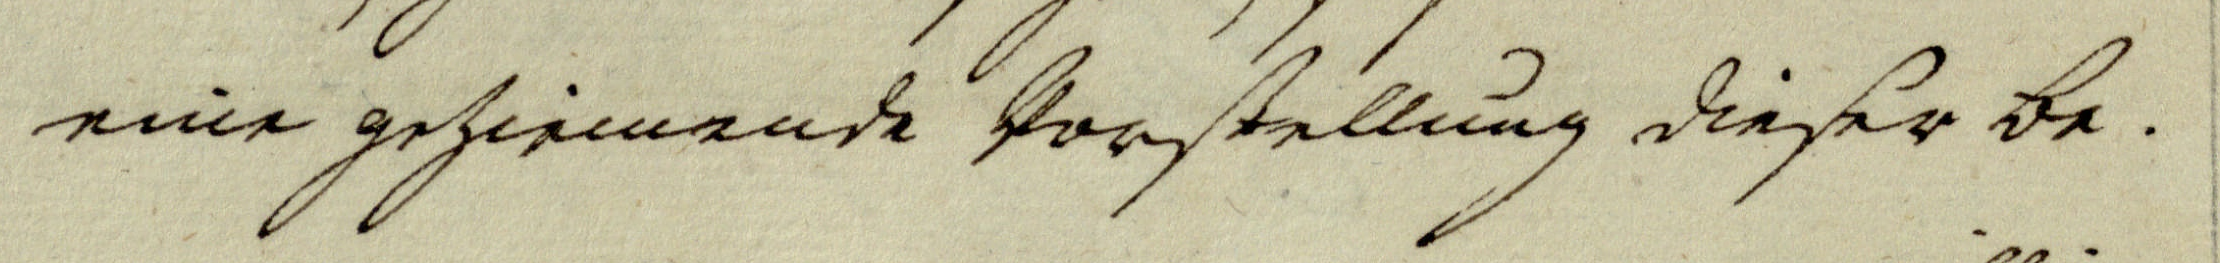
eine geziemende Vorstellung dieser Be¬
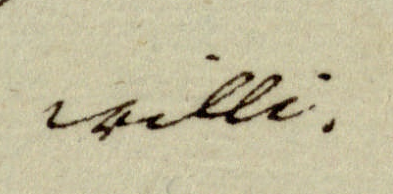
willi
